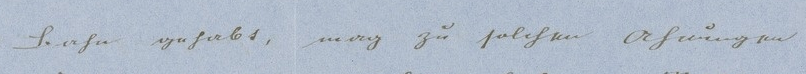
Bahn gehabt, mag zu solchen Ahnungen
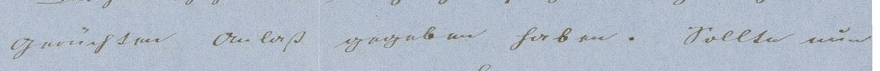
Gerüchten Anlaß gegeben haben. Sollte nun
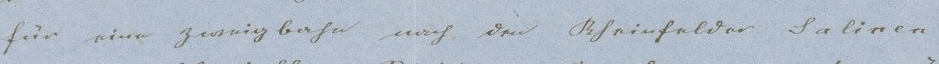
für eine Zweigbahn nach den Rheinfelder Salinen
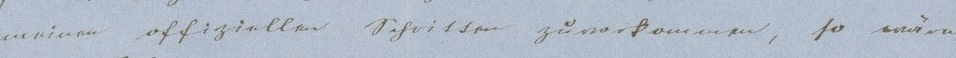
meinen offiziellen Schritten zuvorkommen, so wäre
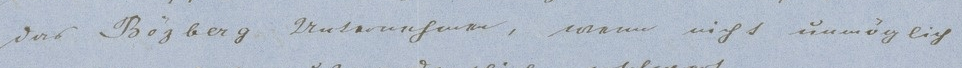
das Bözberg Unternehmen, wenn nicht unmöglich
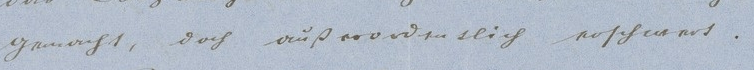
gemacht, doch außerordentlich erschwert.
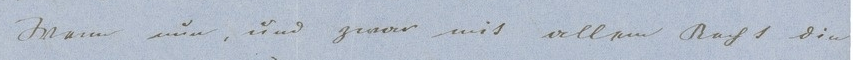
Wenn nun, und zwar mit allem Recht die
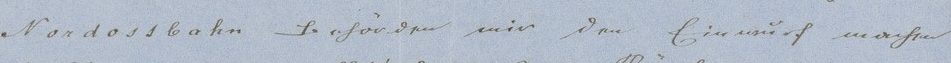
Nordostbahn Behörden mir den Einwurf machen
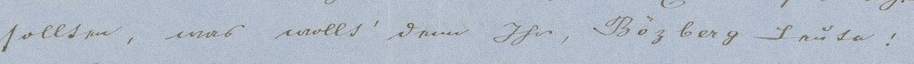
sollten, was wollt' denn Ihr, Bözberg Leute!
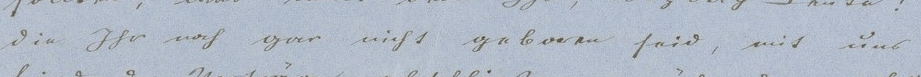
die Ihr noch gar nicht geboren seid, mit uns
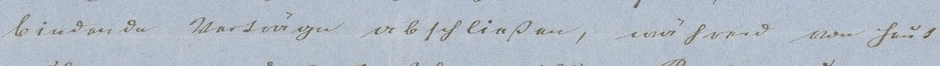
bindende Verträge abschließen, während von heut'
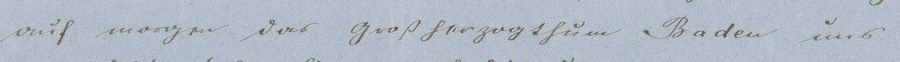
auf morgen das Großherzogthum Baden uns
